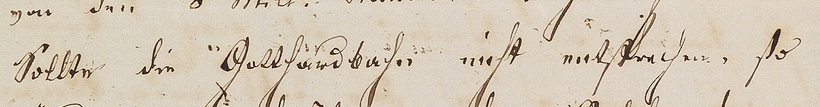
Sollte die Gotthardbahn nicht entsprechen, so
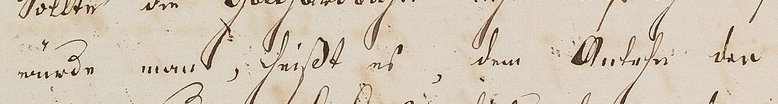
würde man, heißt es, dem Anlehen der
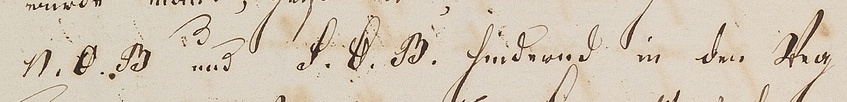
N.O.B. und S.C.B. hindernd in den Weg
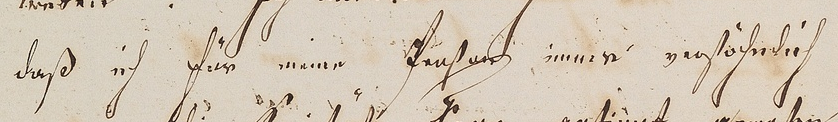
daß ich für meine Person immer versöhnlich
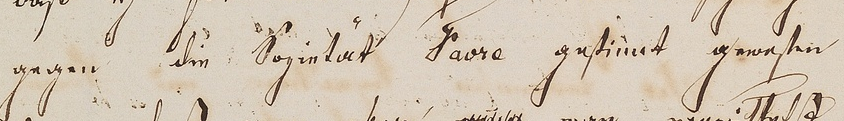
gegen die Sozietät Favre gesinnt gewesen
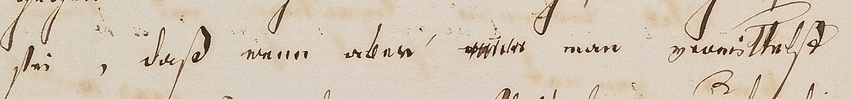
sei, daß wenn aber ... man vermittelst
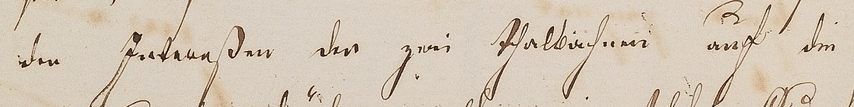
der Intereßen der zwei Thalbahnen auf die
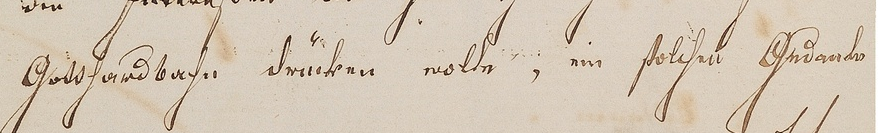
Gotthardbahn drücken wolle, ein solcher Gedanke
